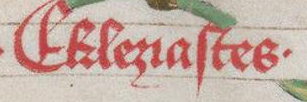Ekleziaſtes .
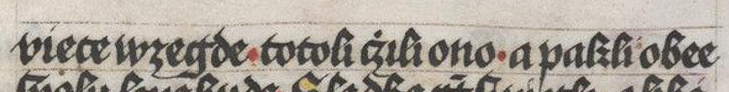viece wzegde. totoli cżili ono.a pakli obee
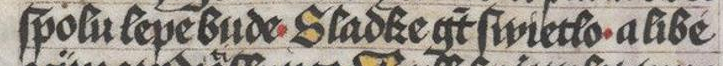ſpolu lepe bude. Sladke ḡt ſwietlo.a libé
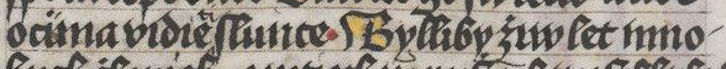oċima vídieti ſlunce. Bylliby żiw let mno¬
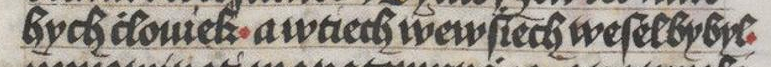hych ċlouiek. a w tiech we wẛiech weſelbybyl.
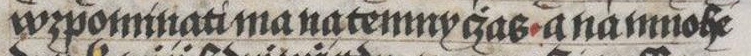wzpomínati ma na temny cżas.a na mnohé
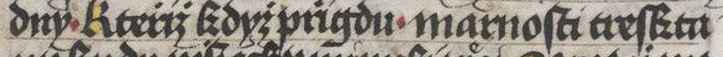dny.Kteṙíż kdyż pṙígdu. marnoſti treſkta¬
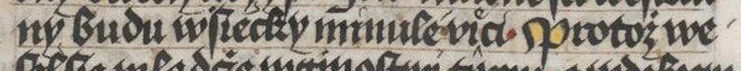ny budu wẛiecky minulé wiͤcí. Protoż we¬
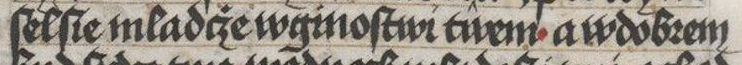ſel ſie mladcże w ginoſtwí twem.a w dobrem
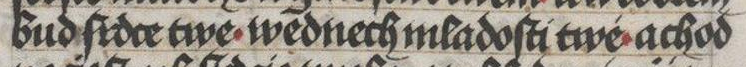buď ſrdce twe.wednech mladoſti twé.a chod
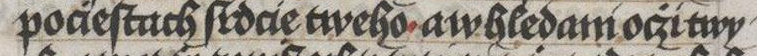po cieſtach ſrdcie tweho.a w hledaní ocżí twy¬
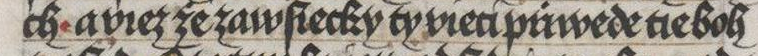ch. a viez że za wẛiecky ty vieci pṙiwede tie boh
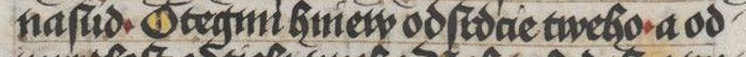na ſud. Otegmi hneiw od ſrdcie tweho.a od¬
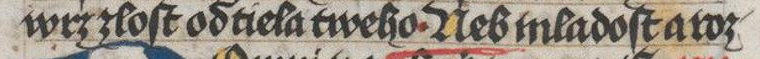wrz zloſt od tiela tweho.Neb mladoſt a roz¬
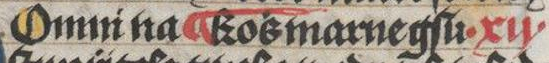Omni na koṡ marne gſu.xij.
